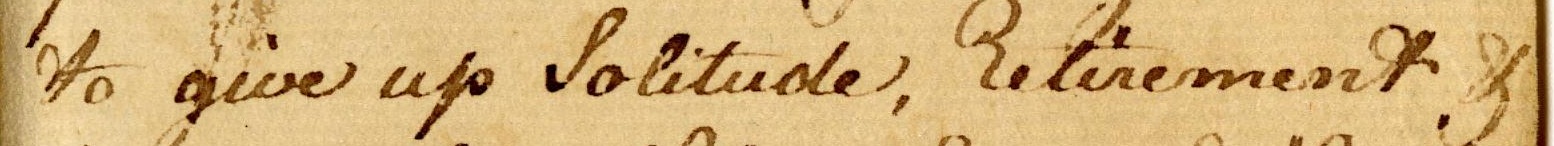to give up Solitude, Retirement &
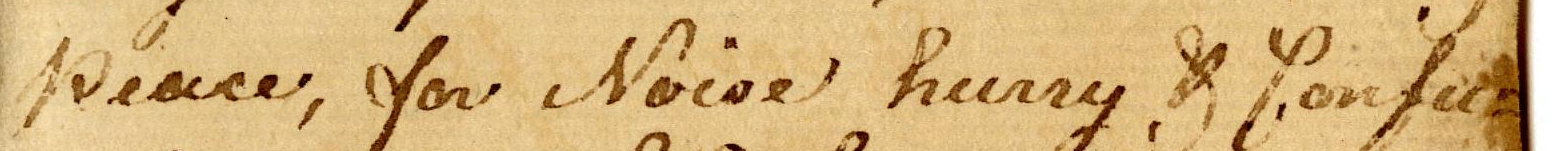Peace, for Noise hurry & Confu-
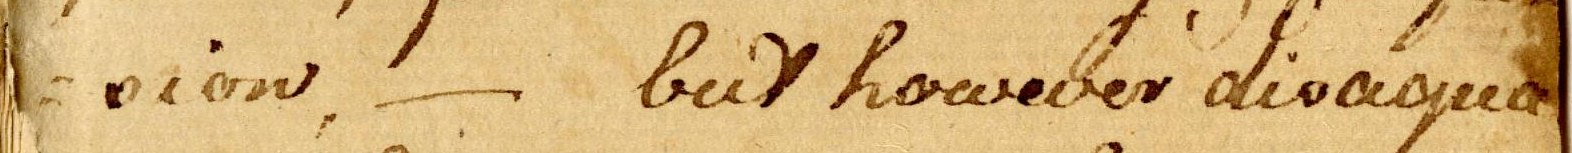-sion- but however disagrea
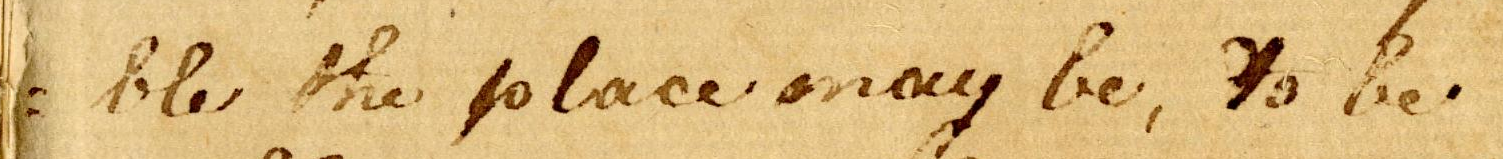-ble the place may be, to be
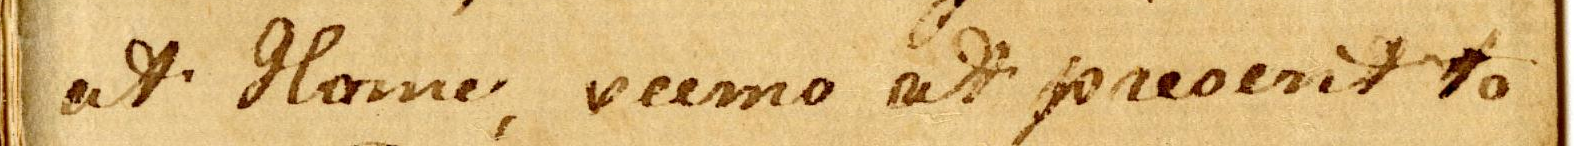at Home, seems at present to
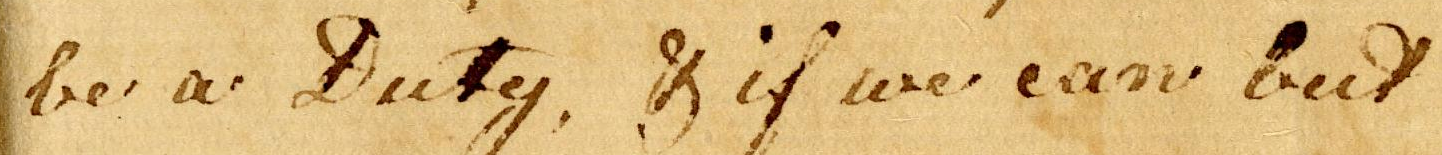be a Duty & if we can but
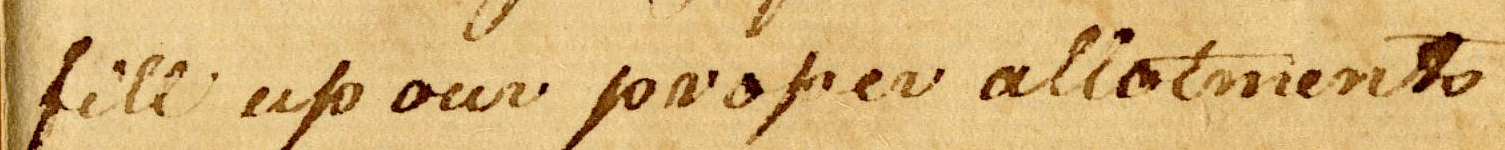fill up our proper allotments
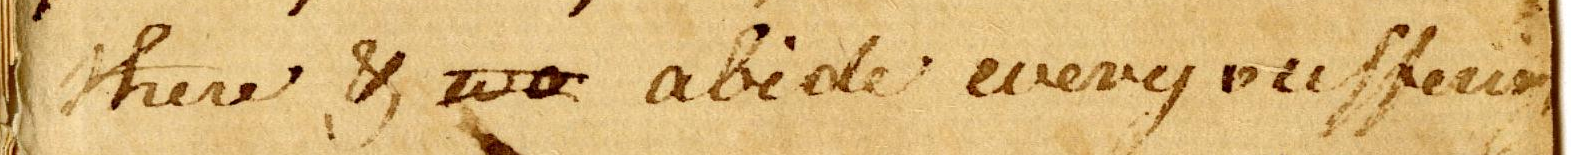there & [wo] abide every suffering
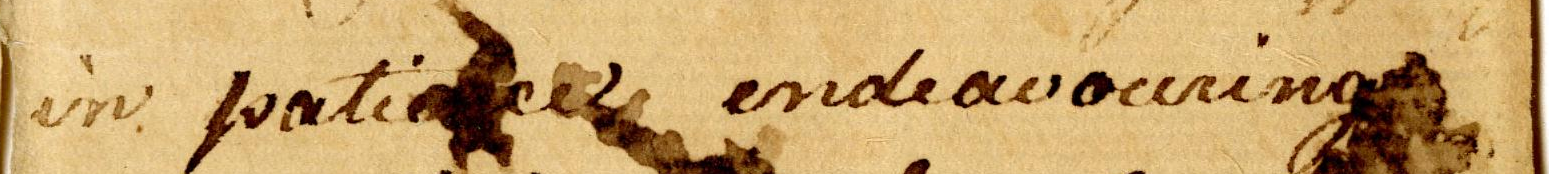in patience endeavouring
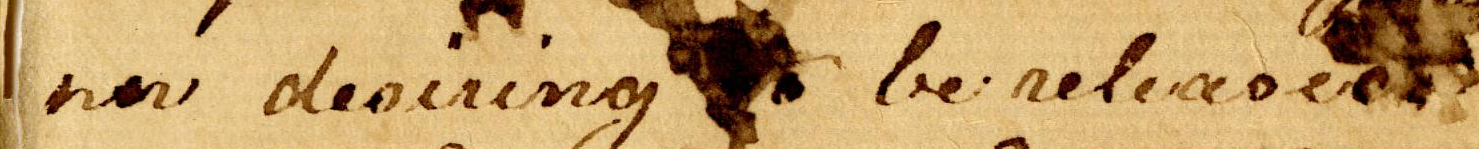nor desiring to be released
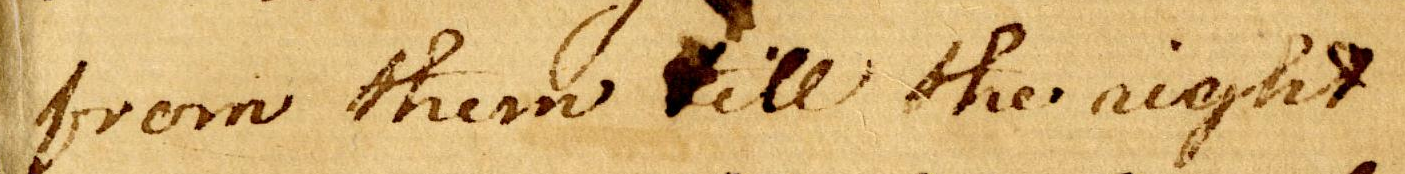from them till the right
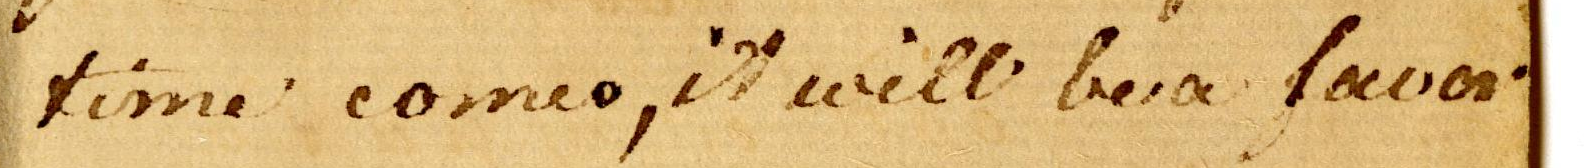time comes, it will be a favor
